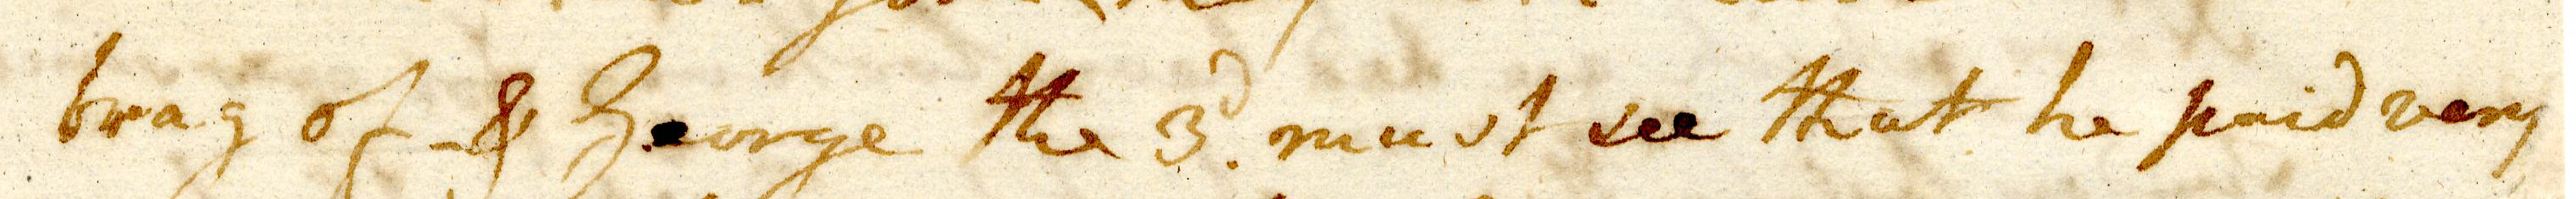brag of & George the 3^d. must see that he paid very
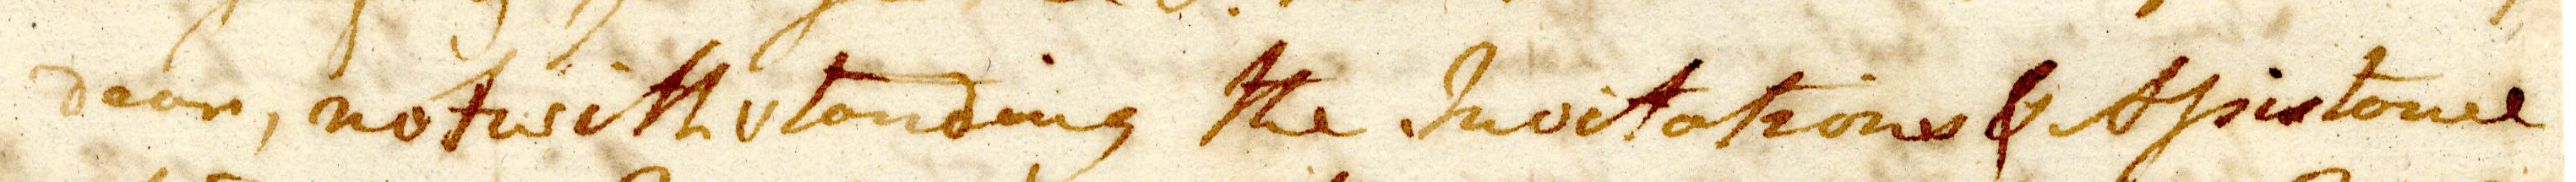dear, notwithstanding the Invitations & Assistance
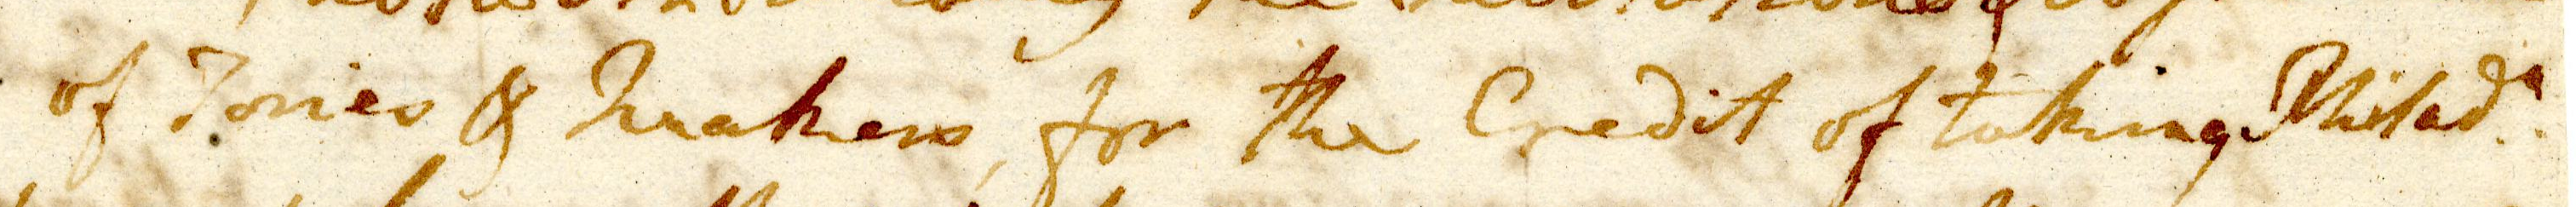of Tories & Quakers, for the Credit of taking Philad^a.
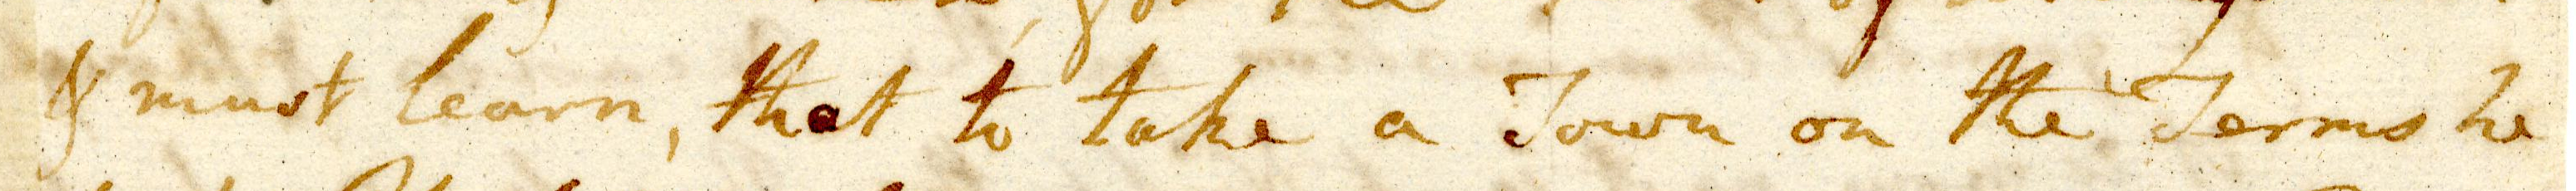& must learn that to take a Town on the Terms he
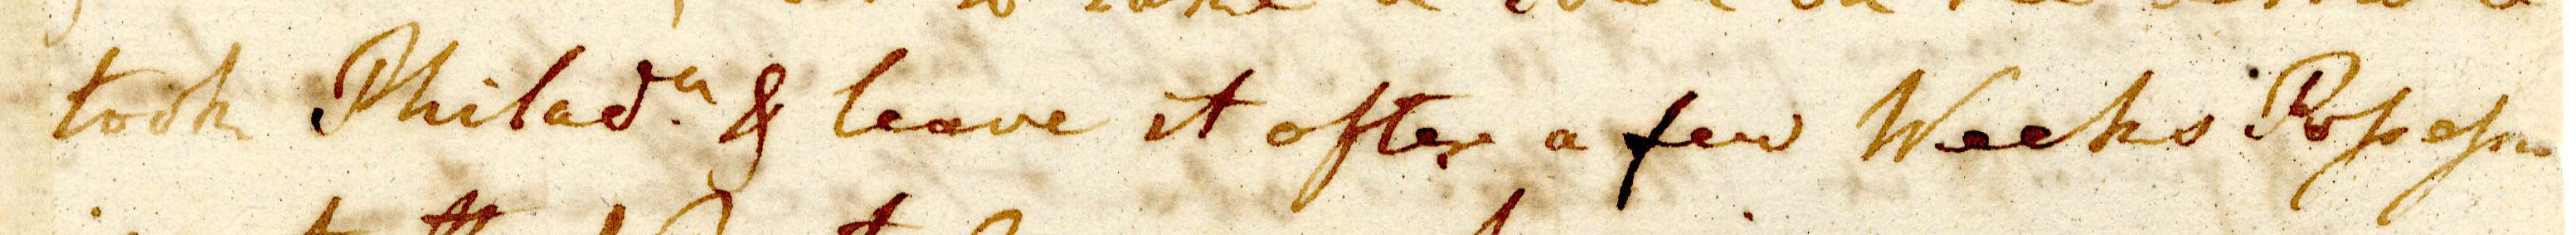took Philad^a. & leave it after a few Weeks Possession
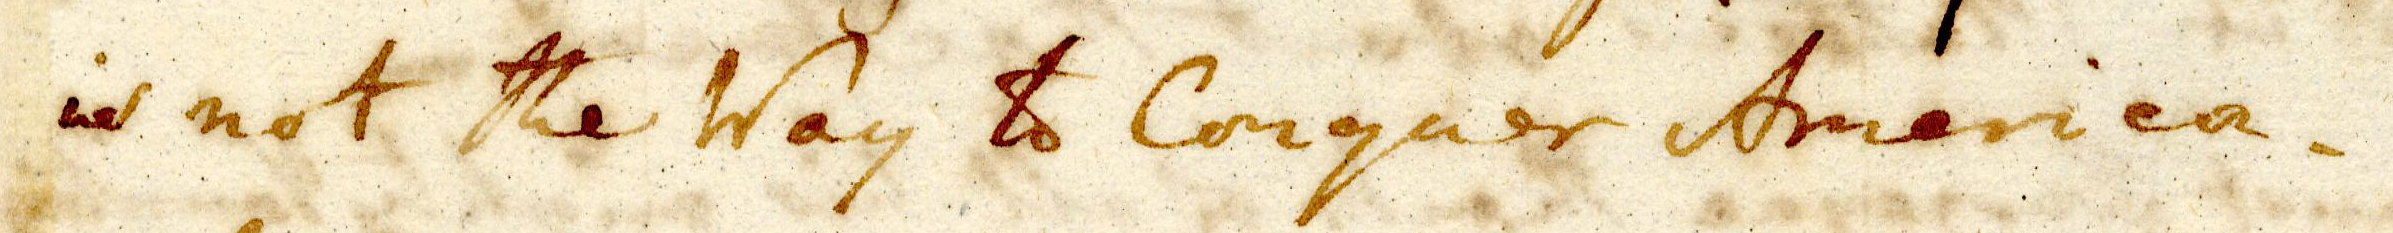is not the Way to Conquer America.
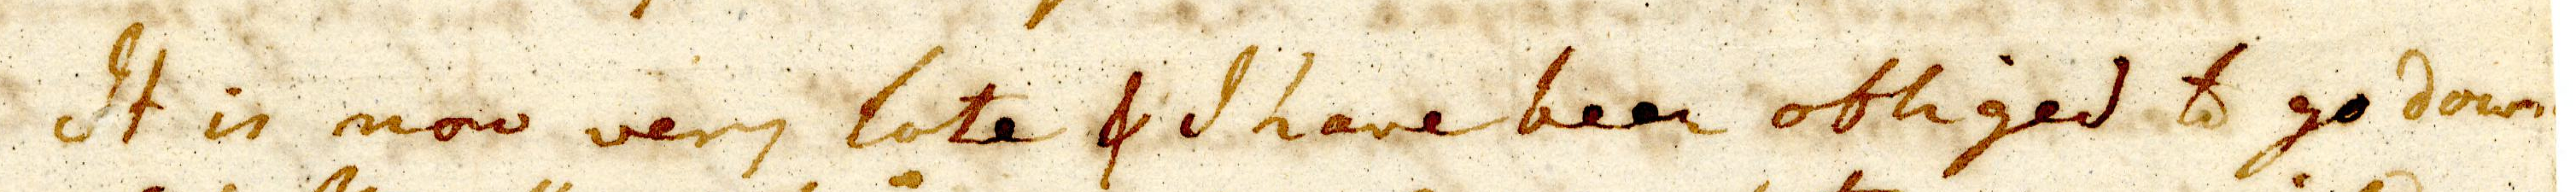It is now very late & I have been obliged to go down
